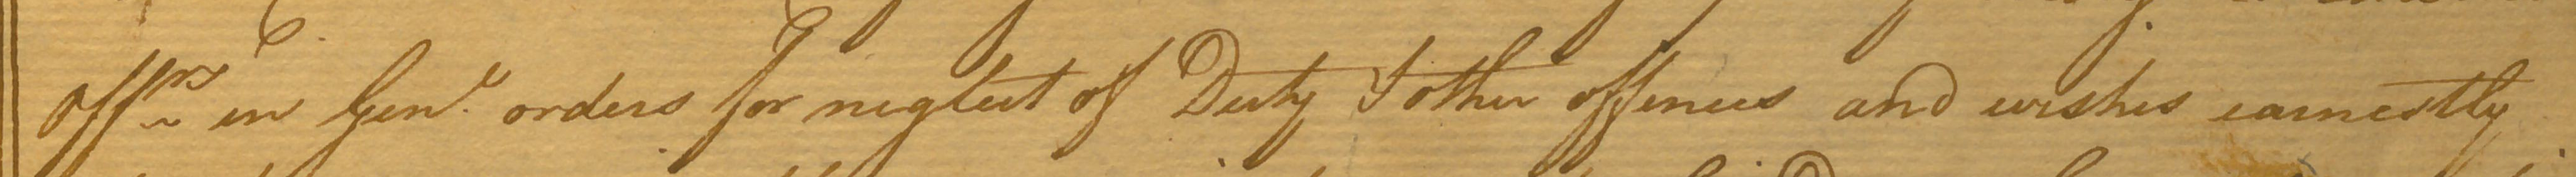Off^rs. in Gen^l. orders for neglect of Duty & other offences and wishes earnestly
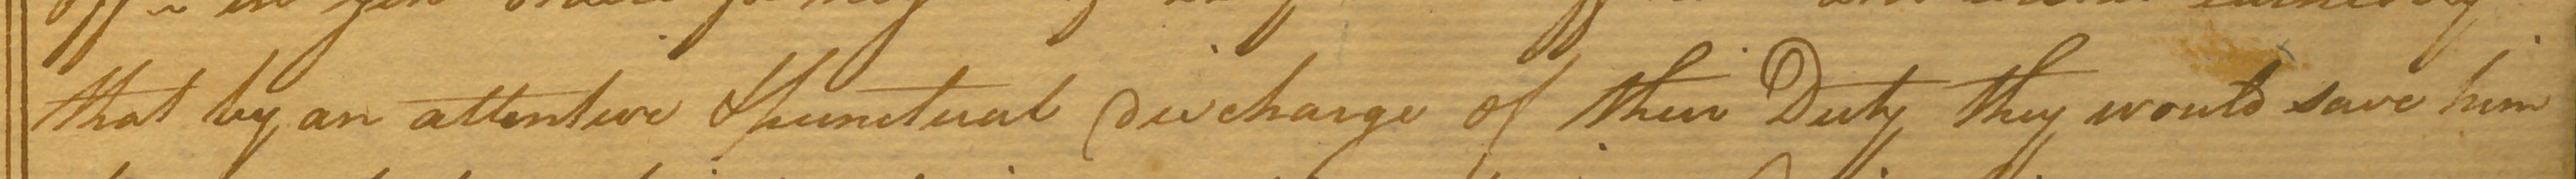that by an attentive & punctual discharge of their Duty they would save him
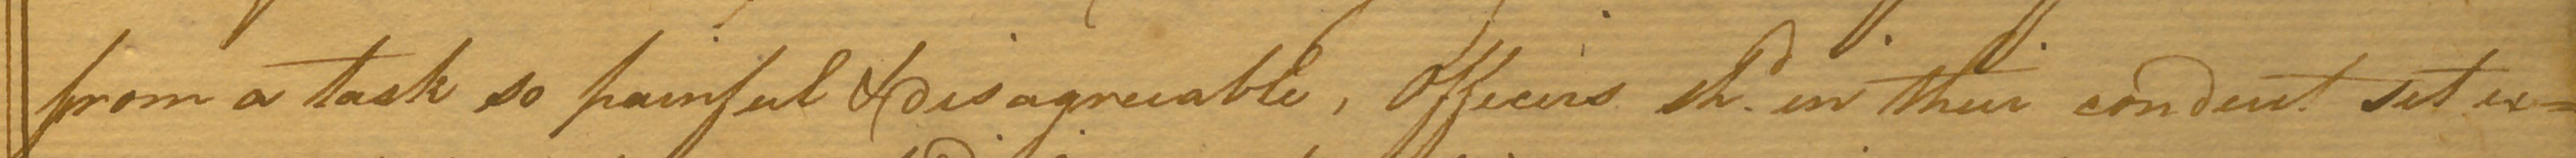from a task so painful & disagreeable, Officers sh^d. in their conduct set ex-
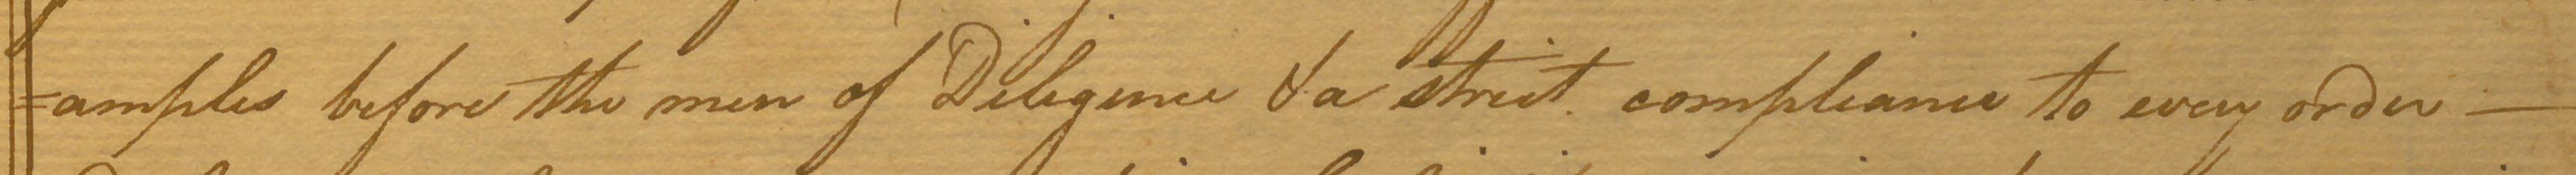-amples before the men of Diligence & a strict compliance to every order-
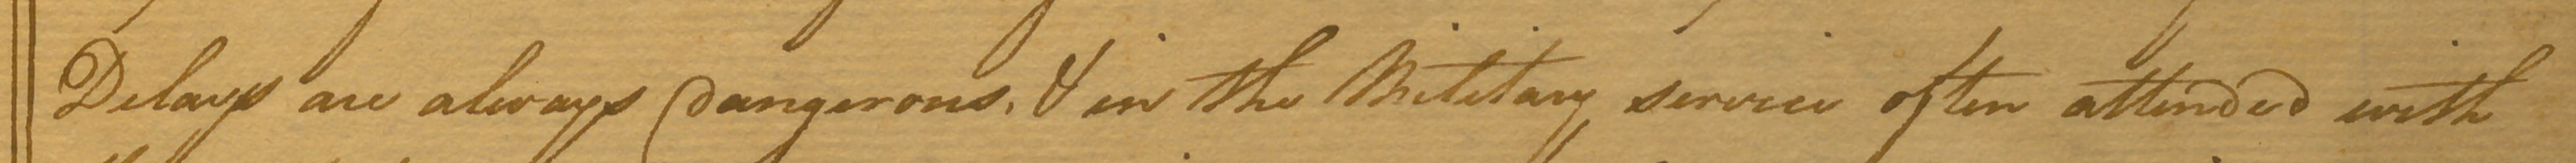Delays are always dangerous, & in the Military service often attended with
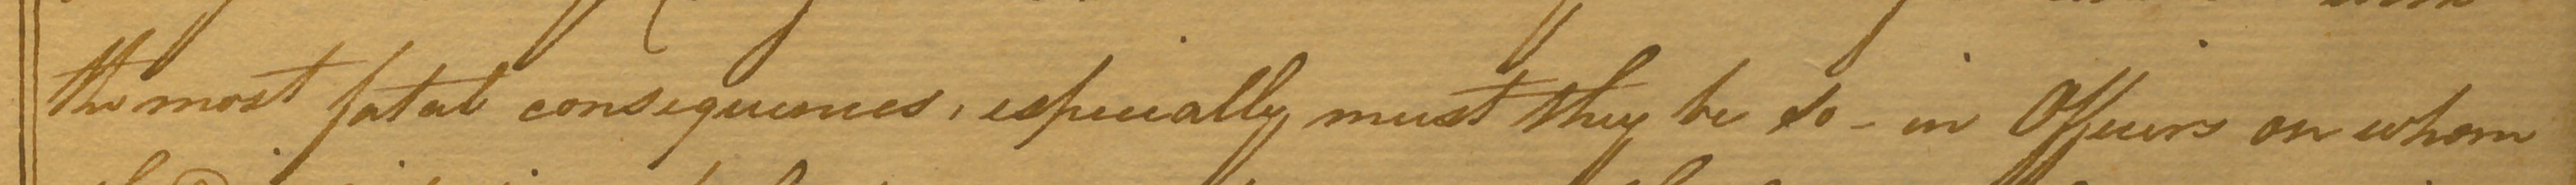the most fatal consequences, especially must they be so- in Officers on whom
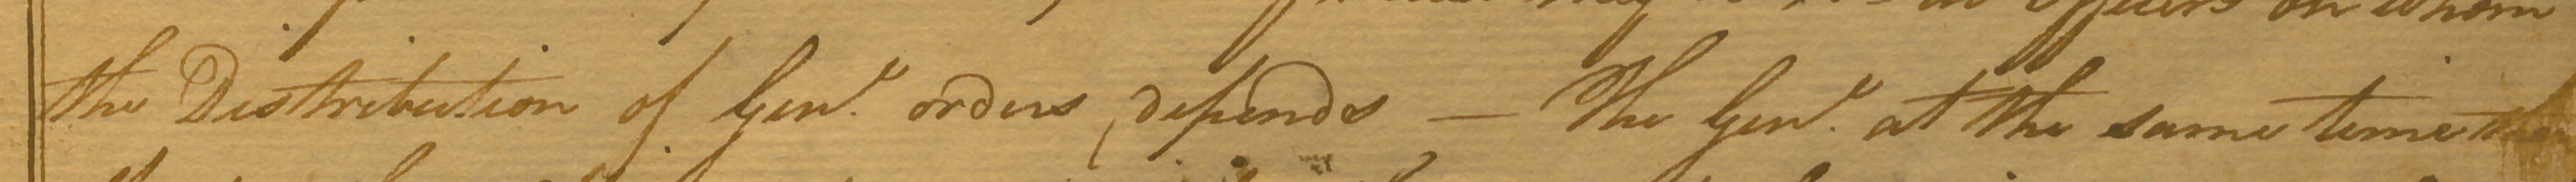the Distribution of Gen^l. orders depends- The Gen^l. at the same time
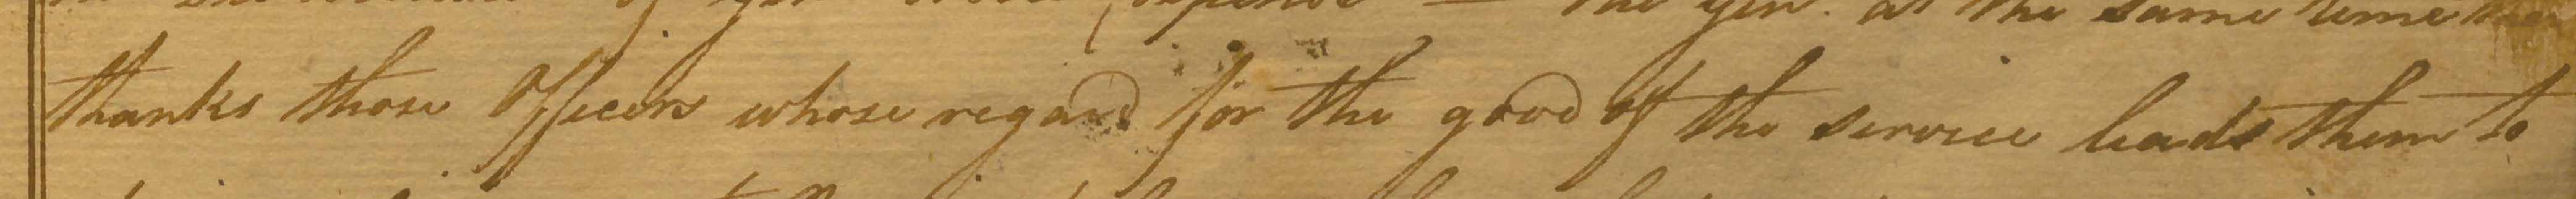thanks those Officers whose regard for the good of the service leads them to
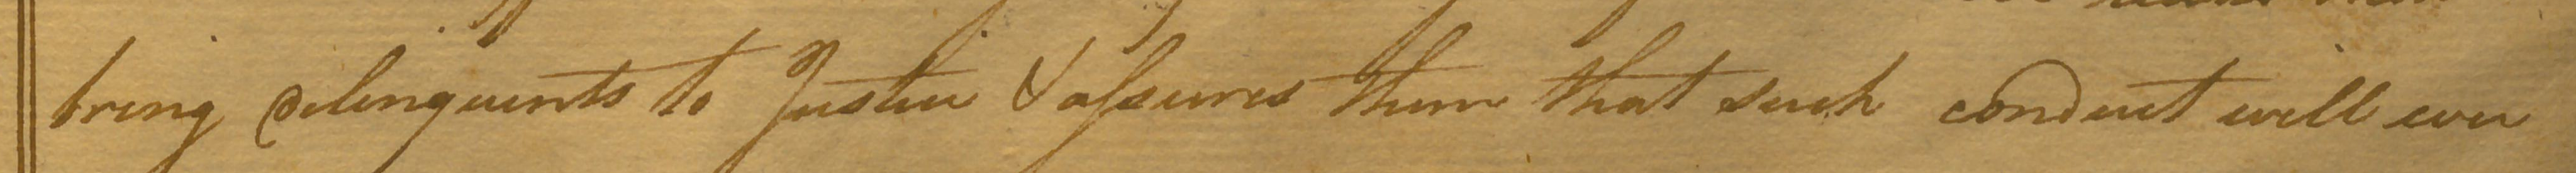bring delinquents to Justice & assures them that such conduct will ever
